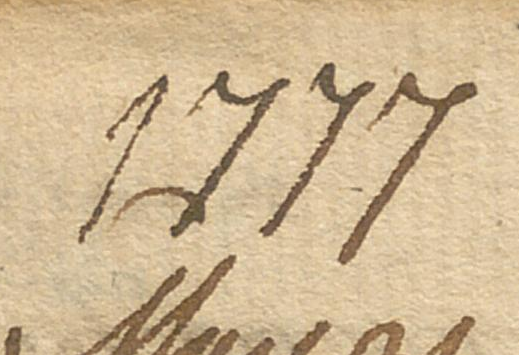1777
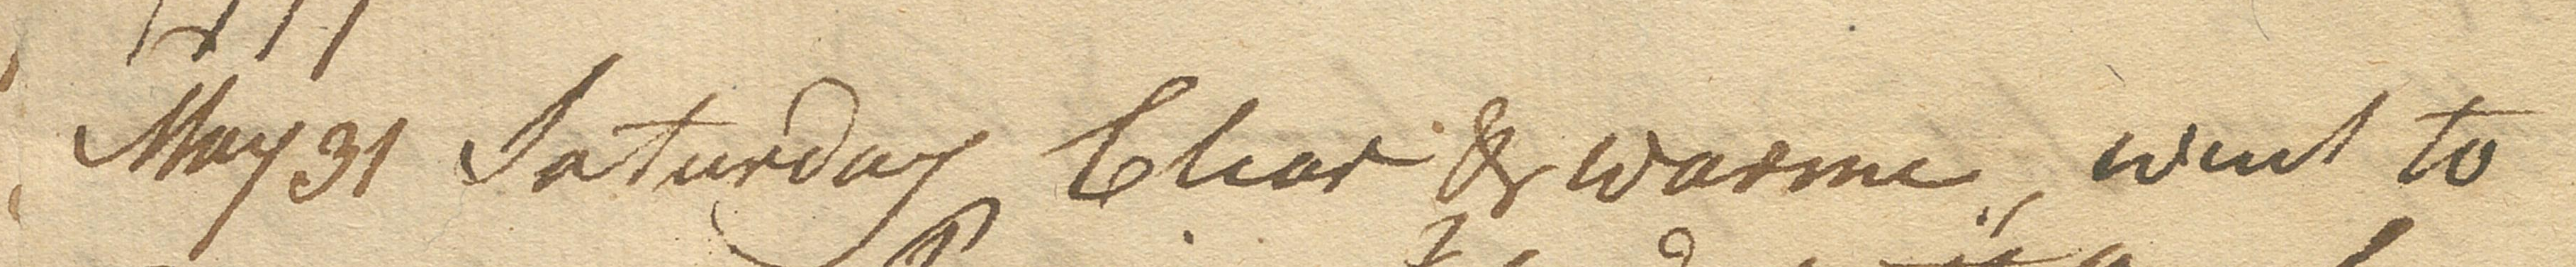May 31 Saturday Clear & warme, went to
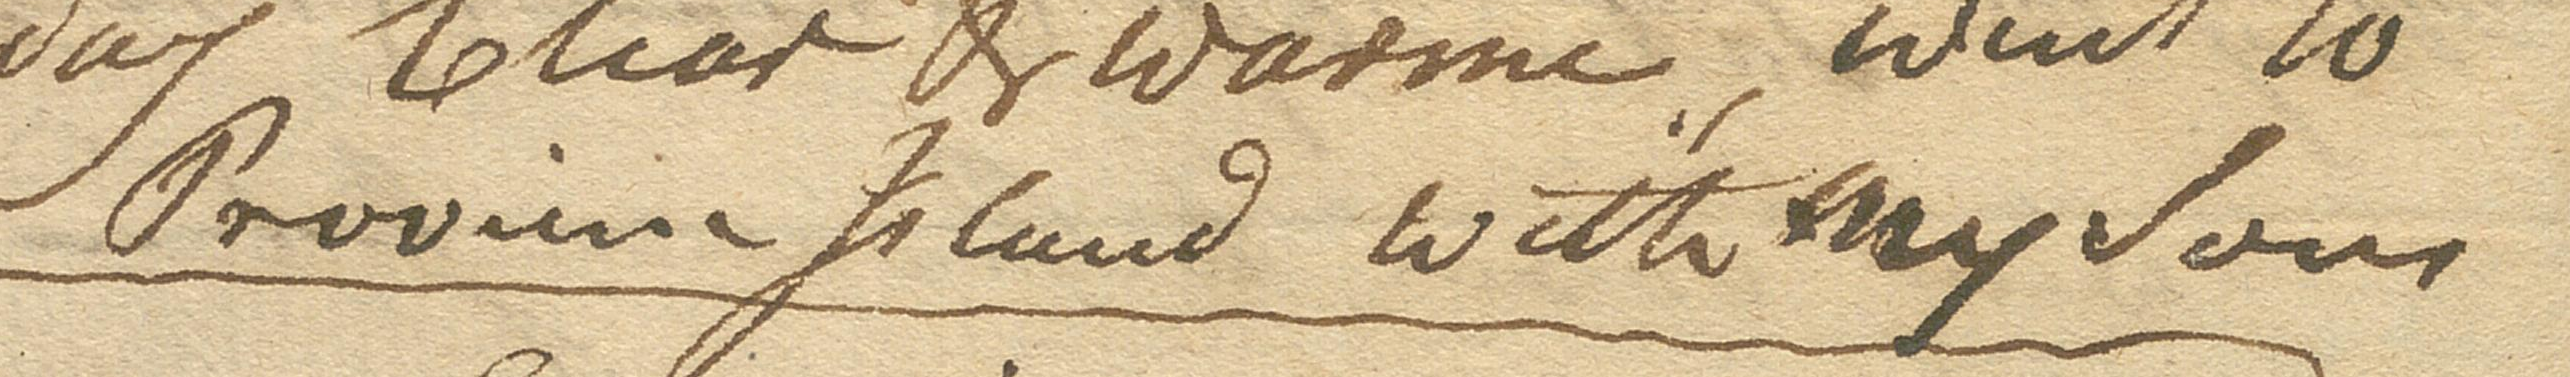Province Island with my Sons
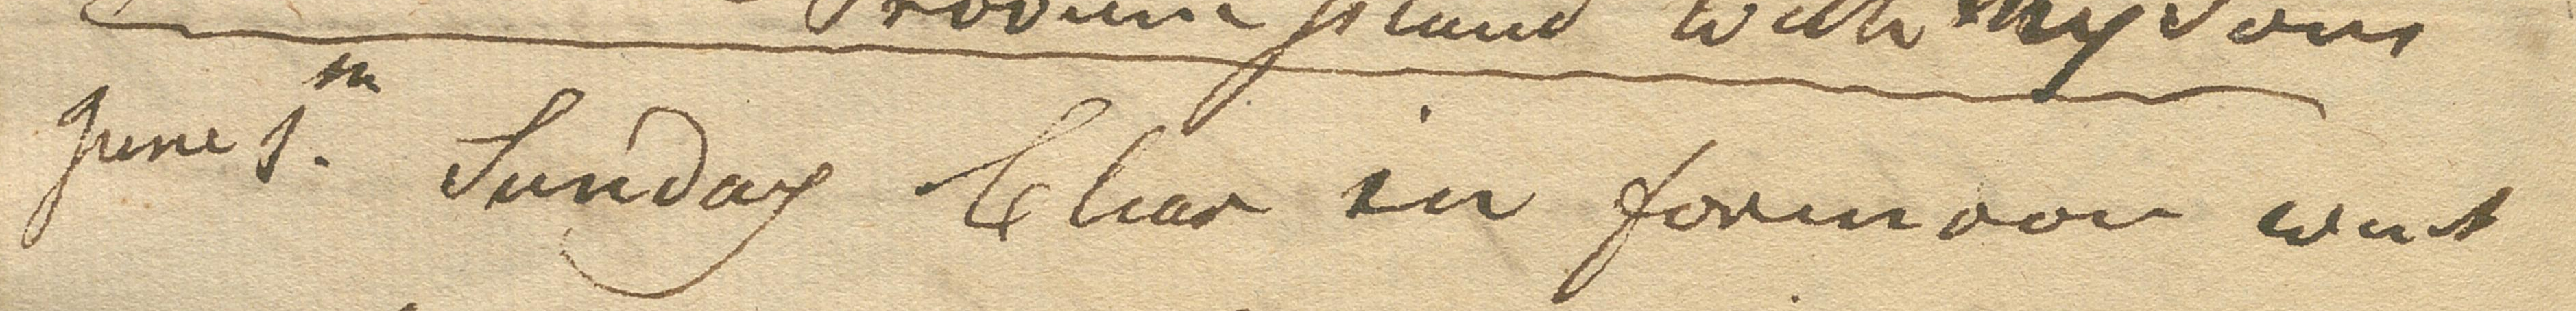June 1^th. Sunday Clear ice forenoon went
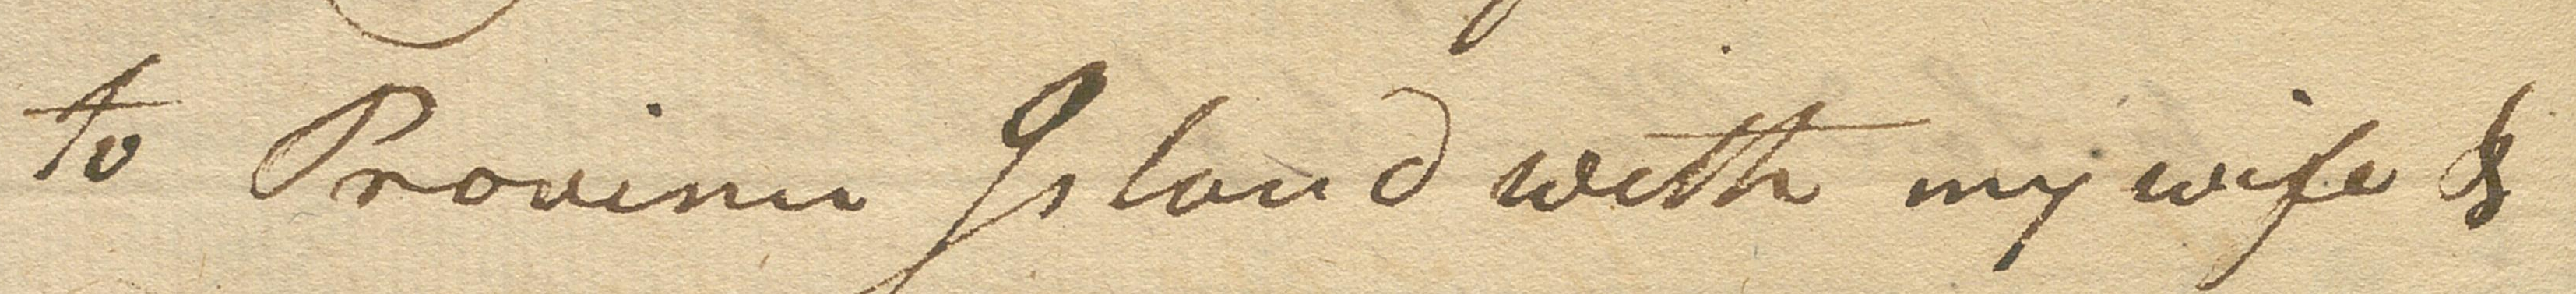to Province Island with my wife &
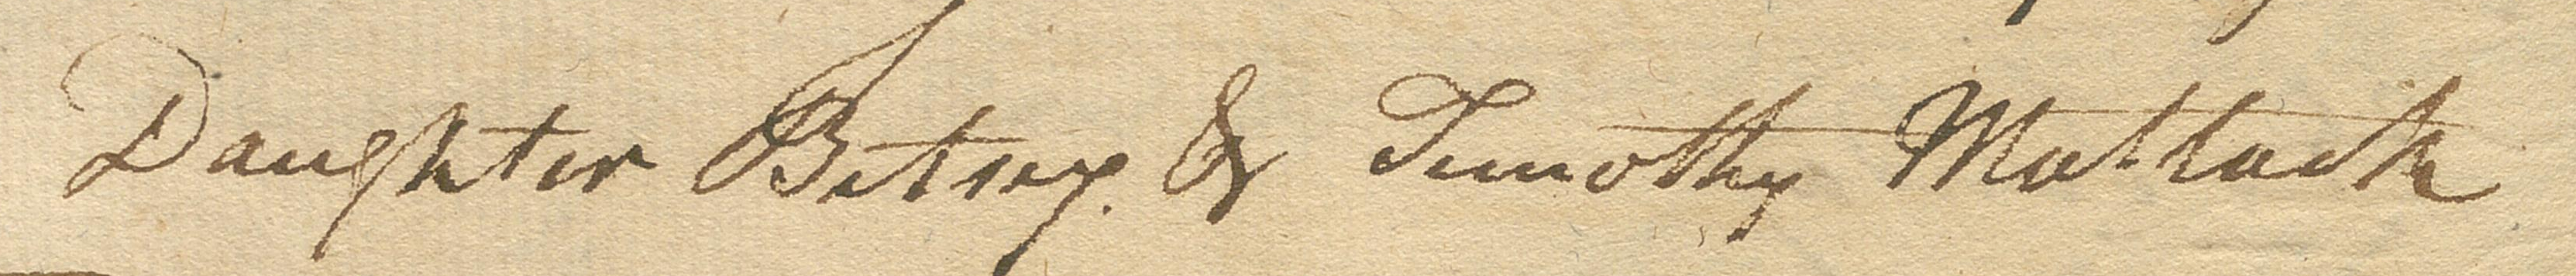Daughter Betsey & Timothy Matlack
